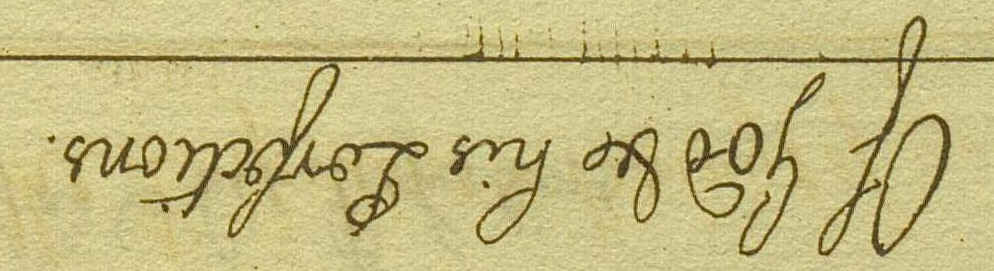Of God & his Perfections.
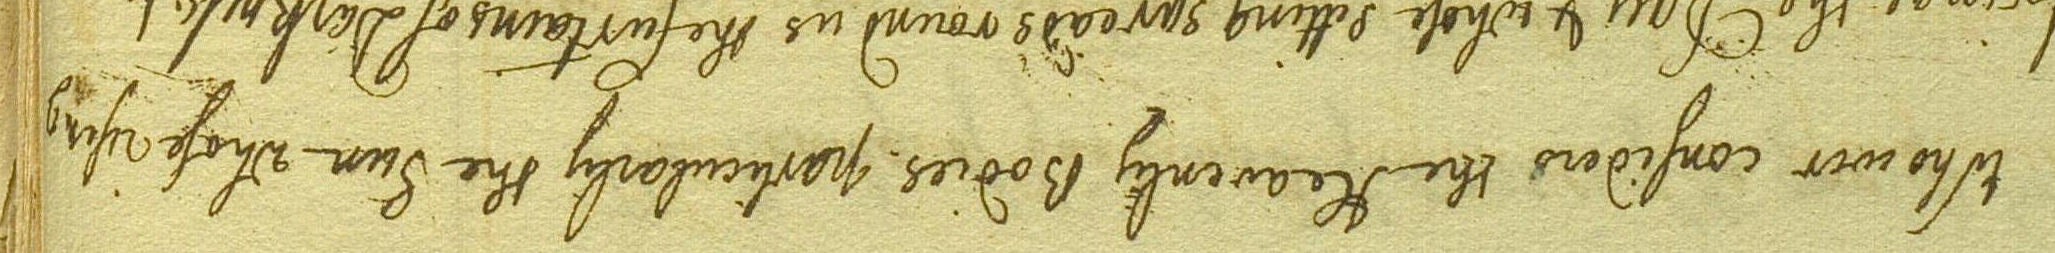Whoever considers the Heavenly Bodies, particularly the Sun whose rising
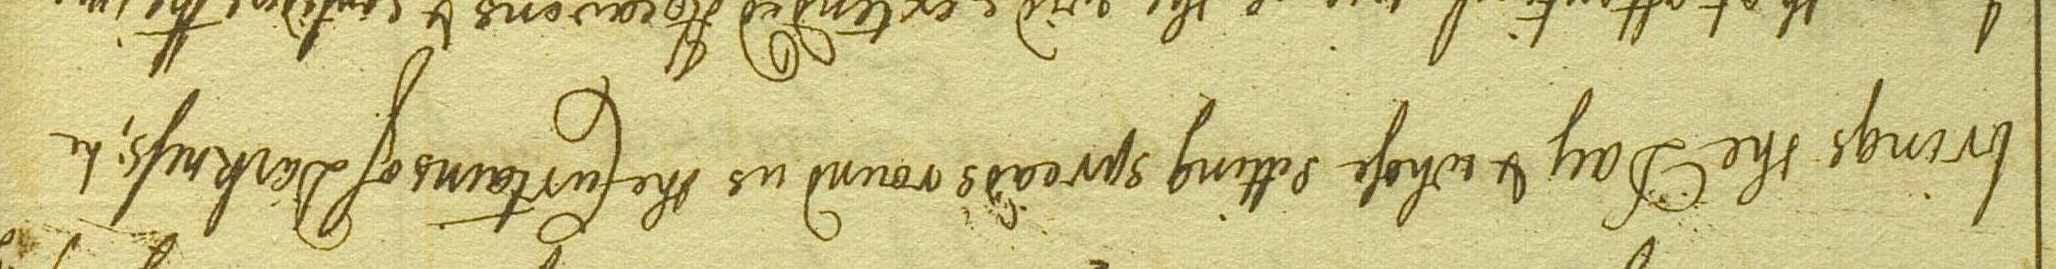brings the Day & whose setting spreads round us the Curtains of Darkness; he
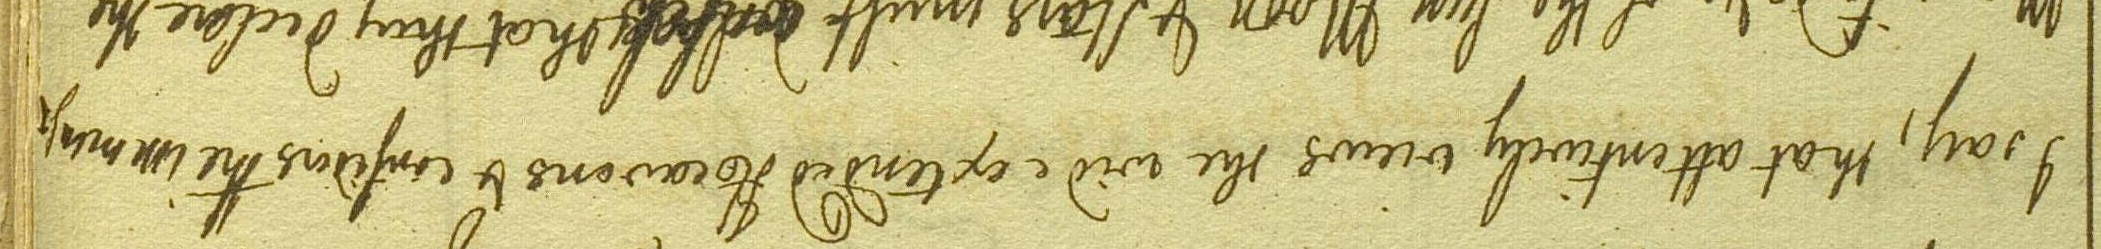I say, that attentively views the wide extended Heavens & considers the immense
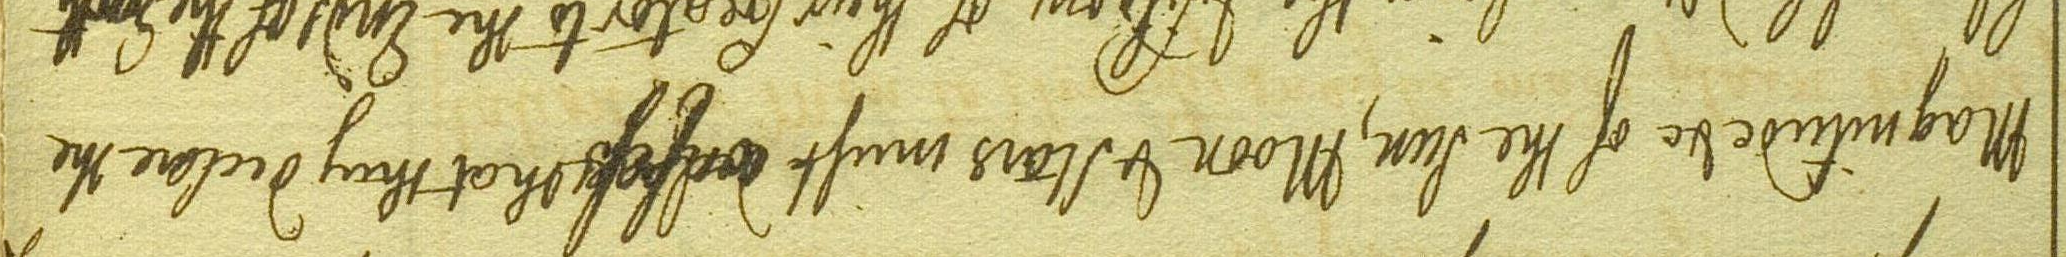Magnitude of the Sun, Moon & Stars must confess that they declare the
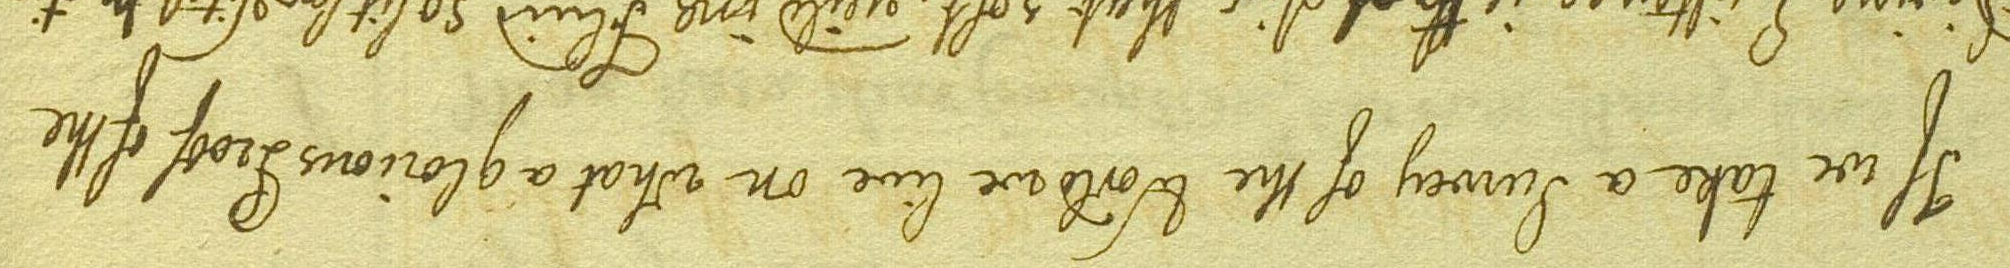If we take a survey of the World we live on what a glorious Proof of the
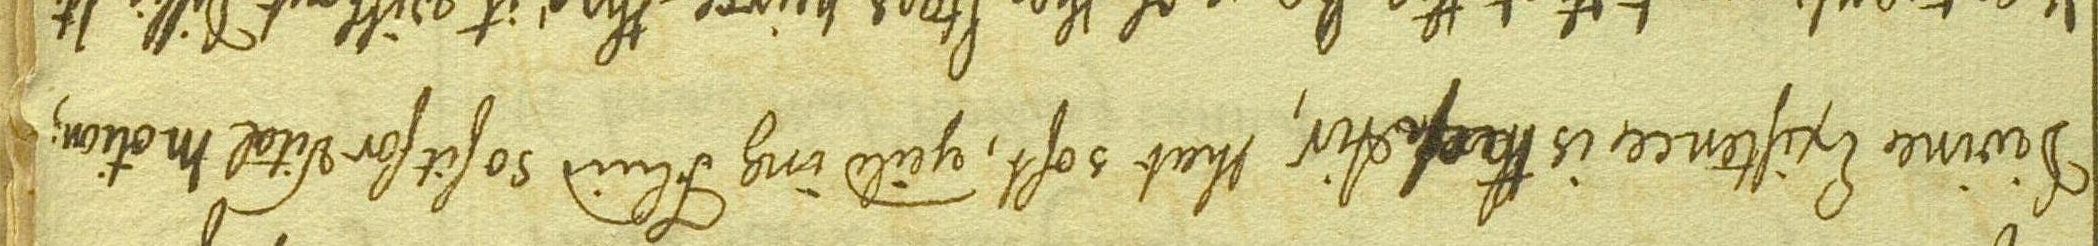Divine Existence is t[__] Air, that soft, yeilding Fluid so fit for vital motion;
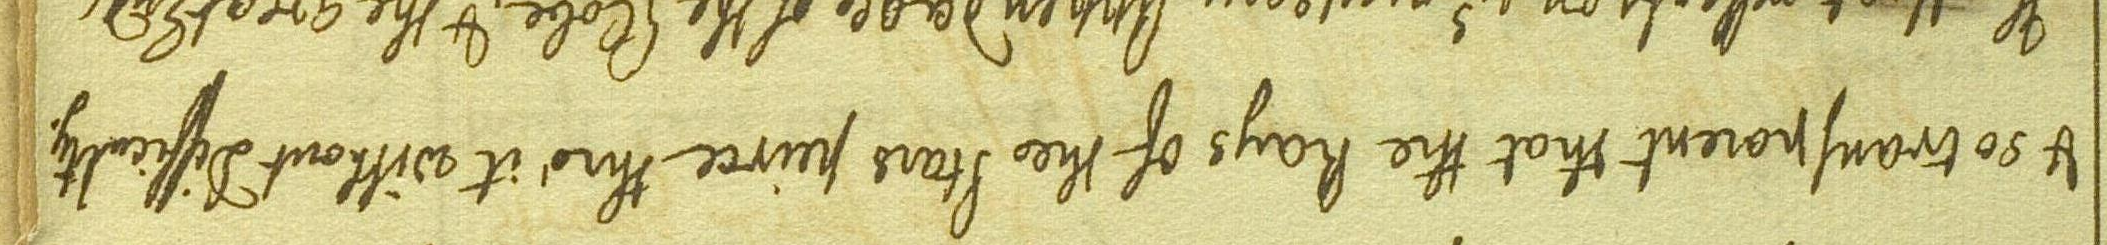& so transparent that the Rays of the Stars peirce thro' it without Difficulty.
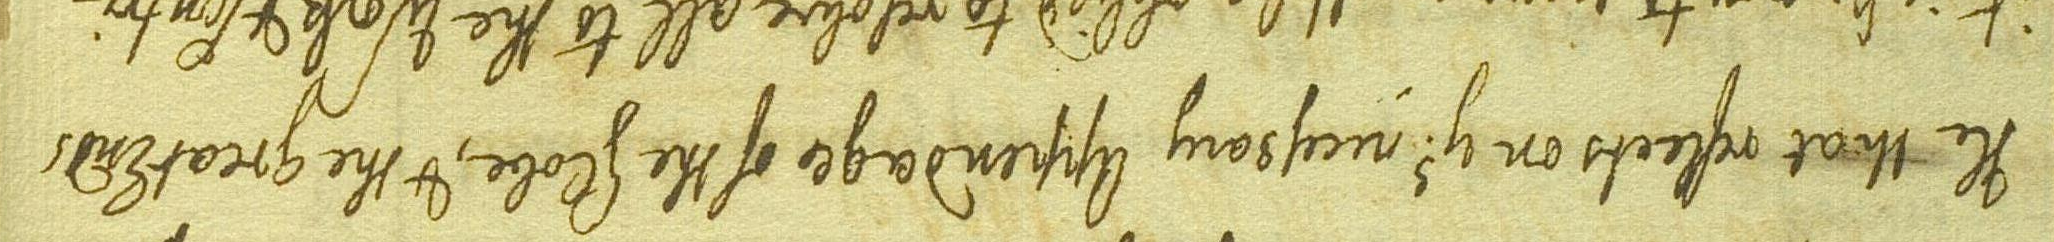He that reflects on y^e. necessary Appendage of the Globe, & the great Ends
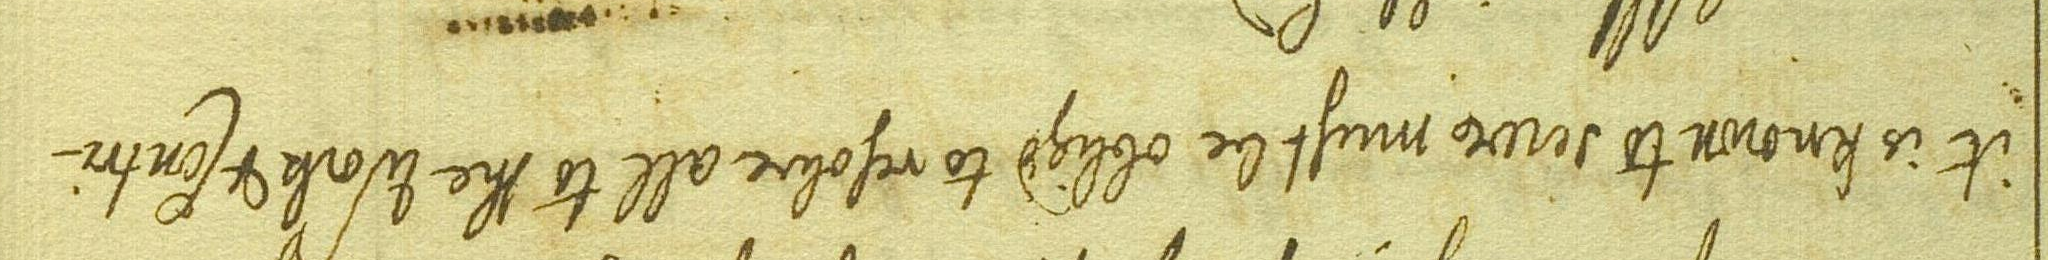it is known to serve must be oblig'd to resolve all to the Work & Contri-
